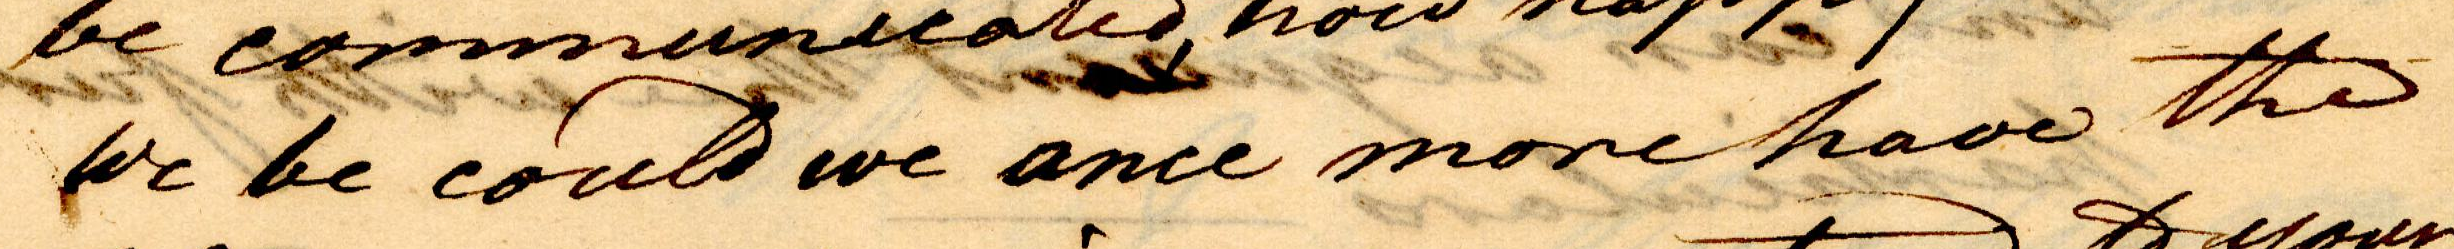we be could we once more have the
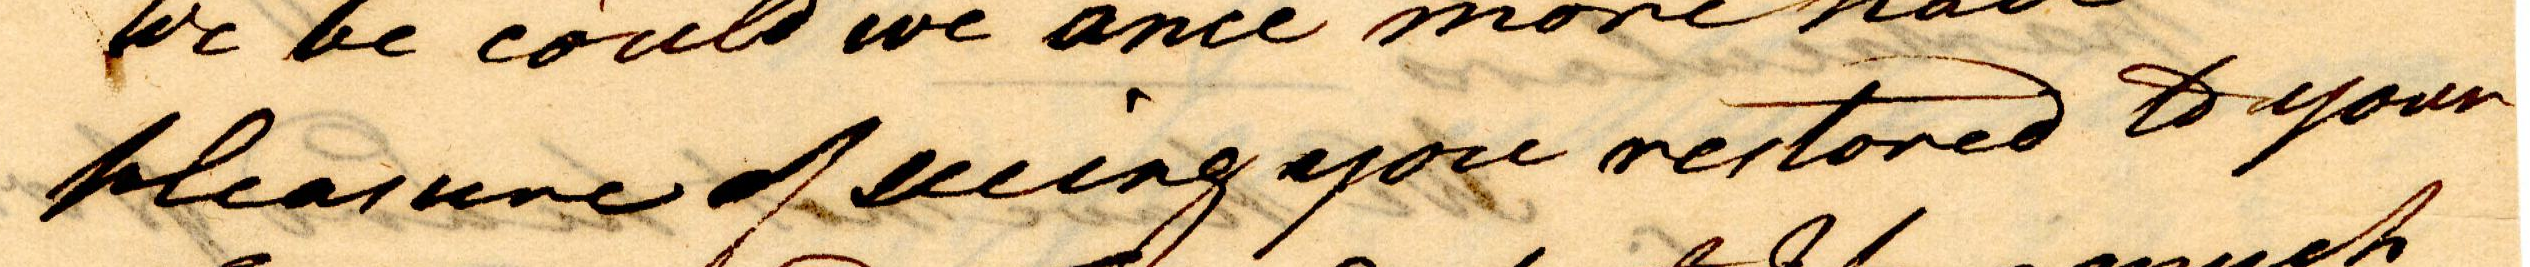pleasures of seeing you restored to your
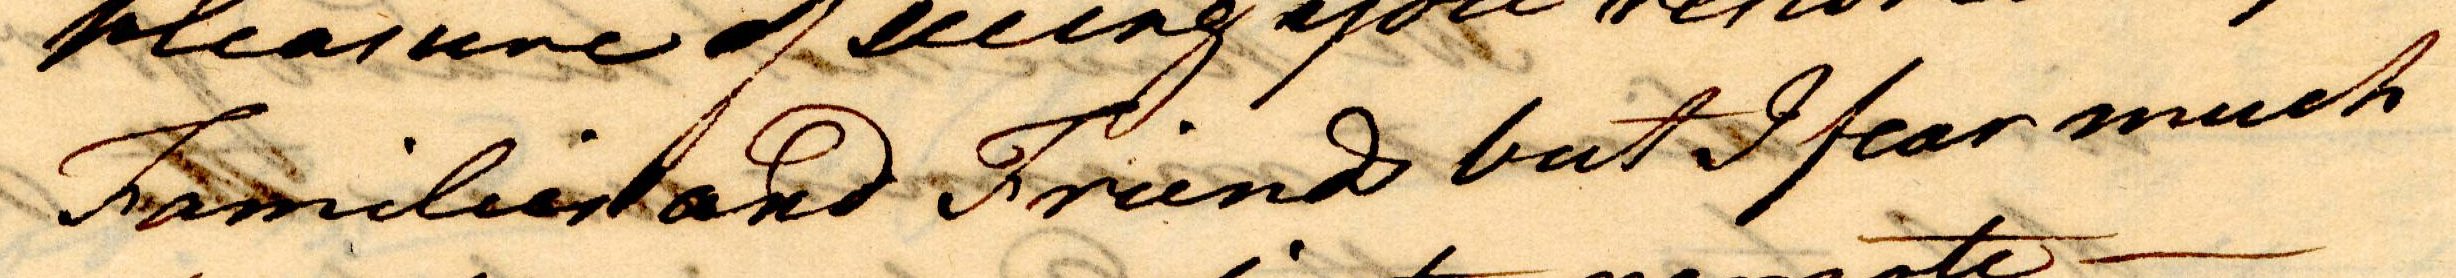Families and Friends but I fear much
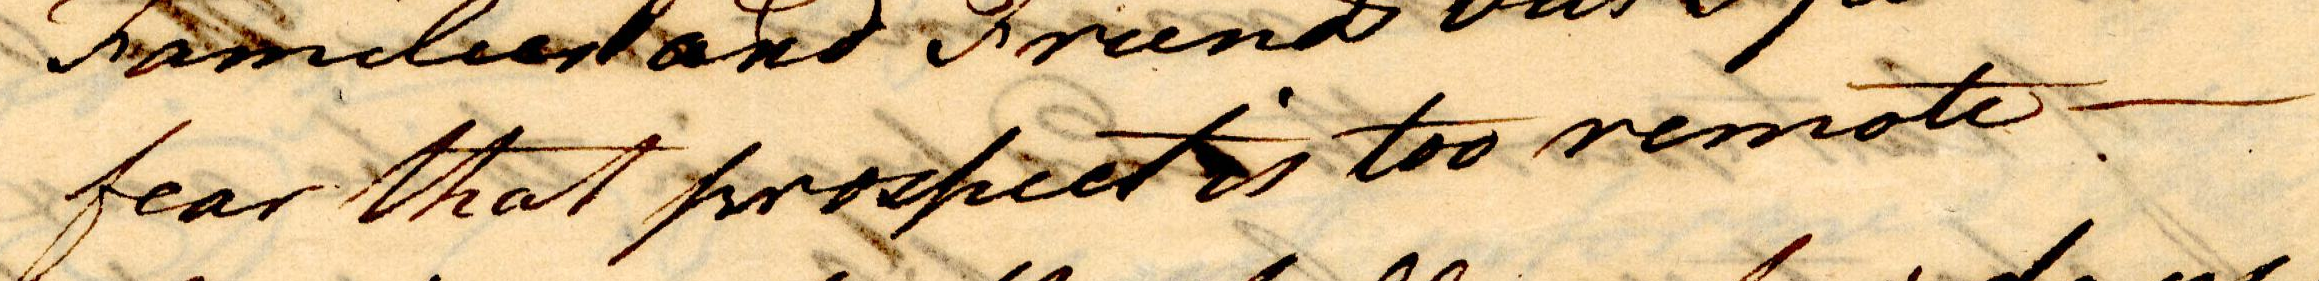fear that prospect is too remote-
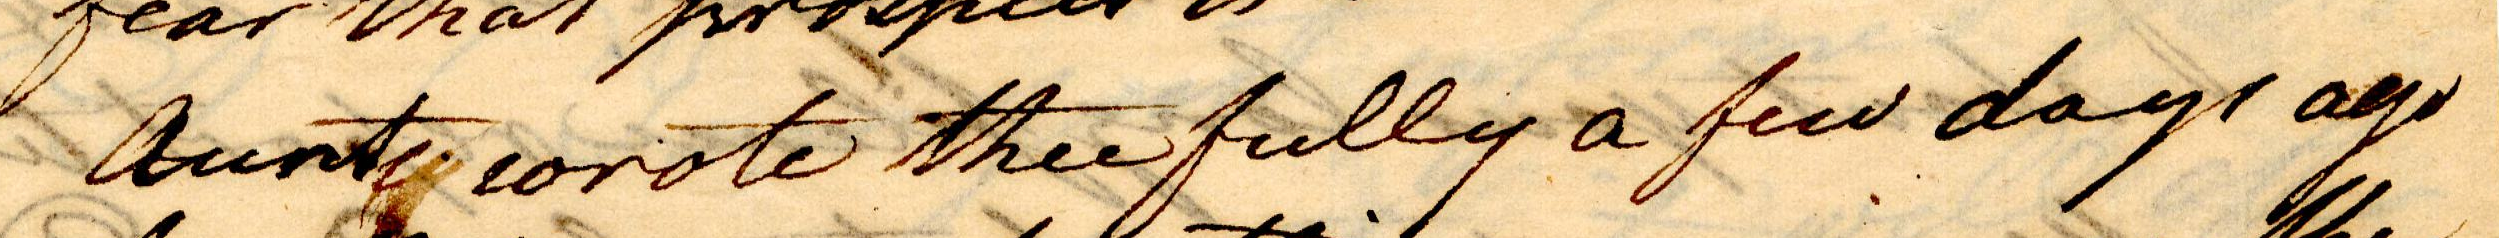Aunt wrote thee fully a few days ago
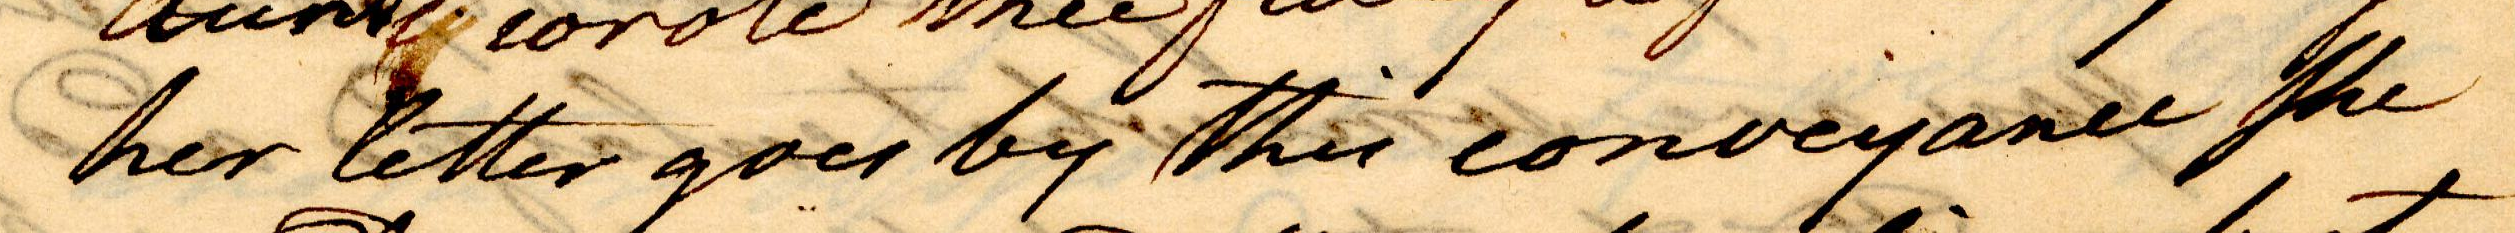her letter goes by this conveyance she
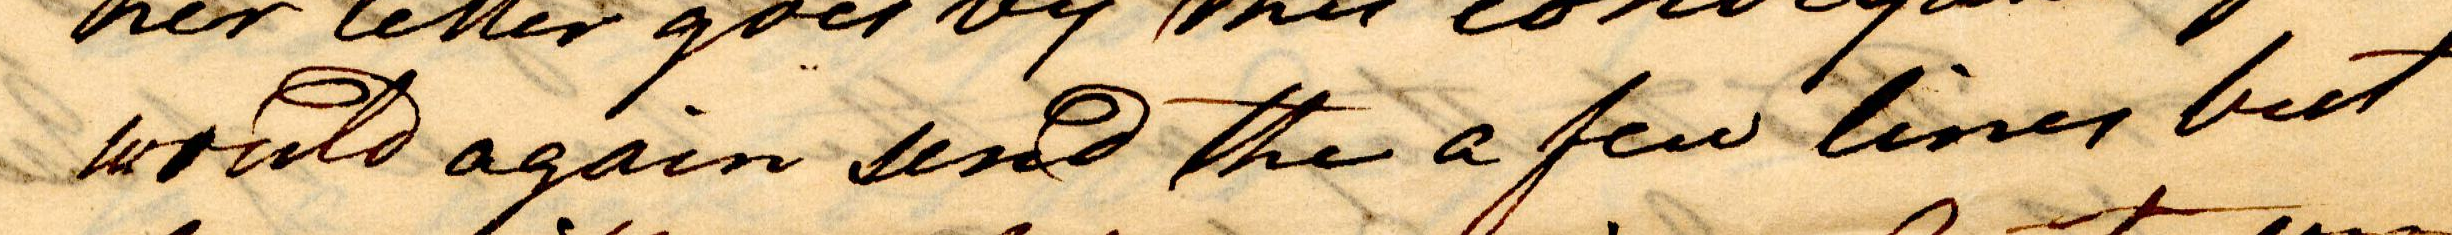would again send the a few lines but
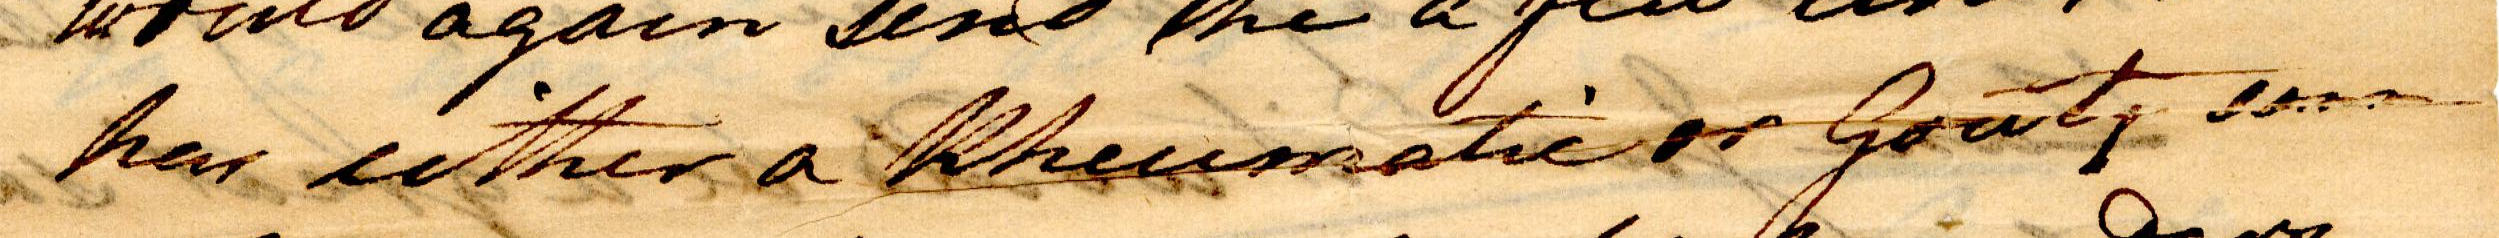has either a Rheumatic or Gouty com-
